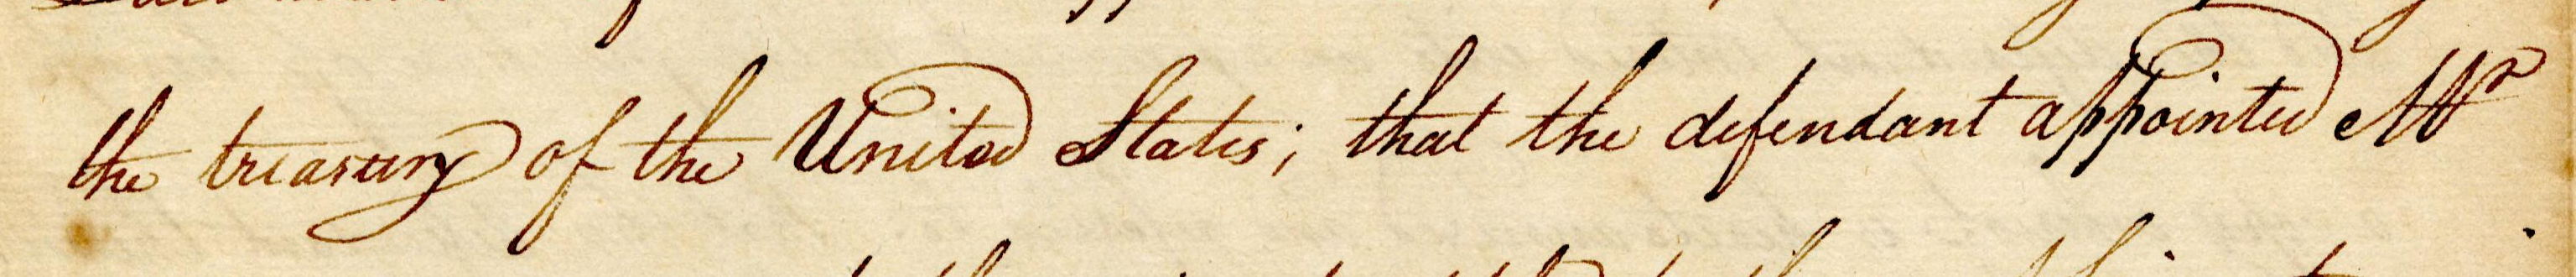the treasury of the United States; that the defendant appointed M^r
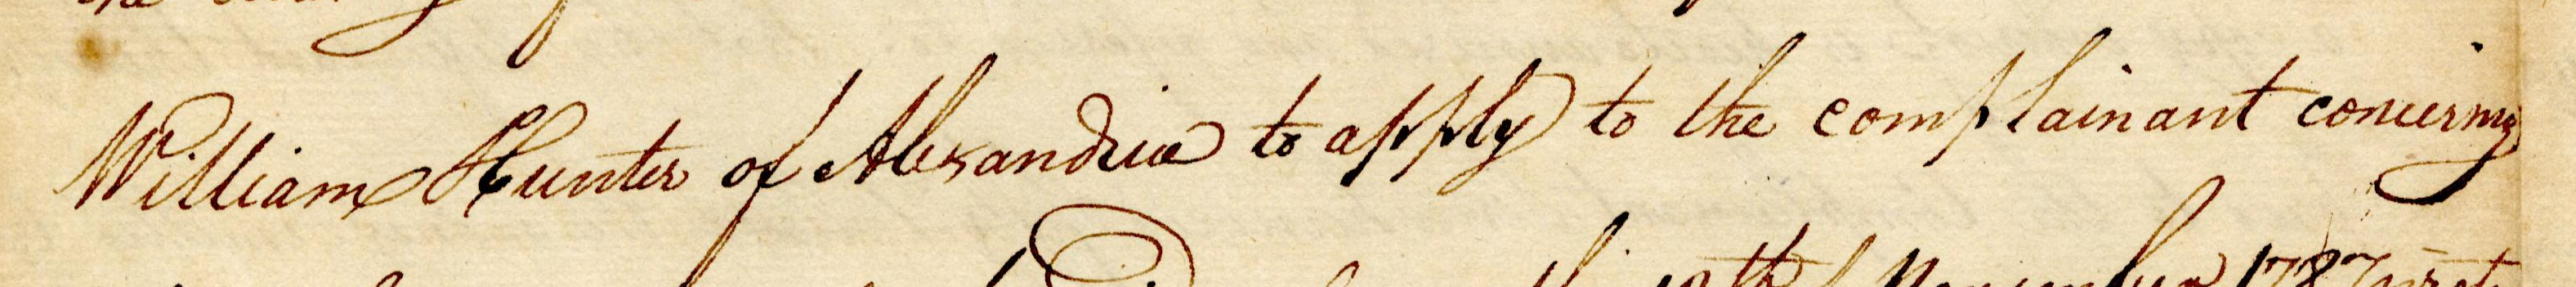William Hunter of Alexandria to apply to the complainant concerning
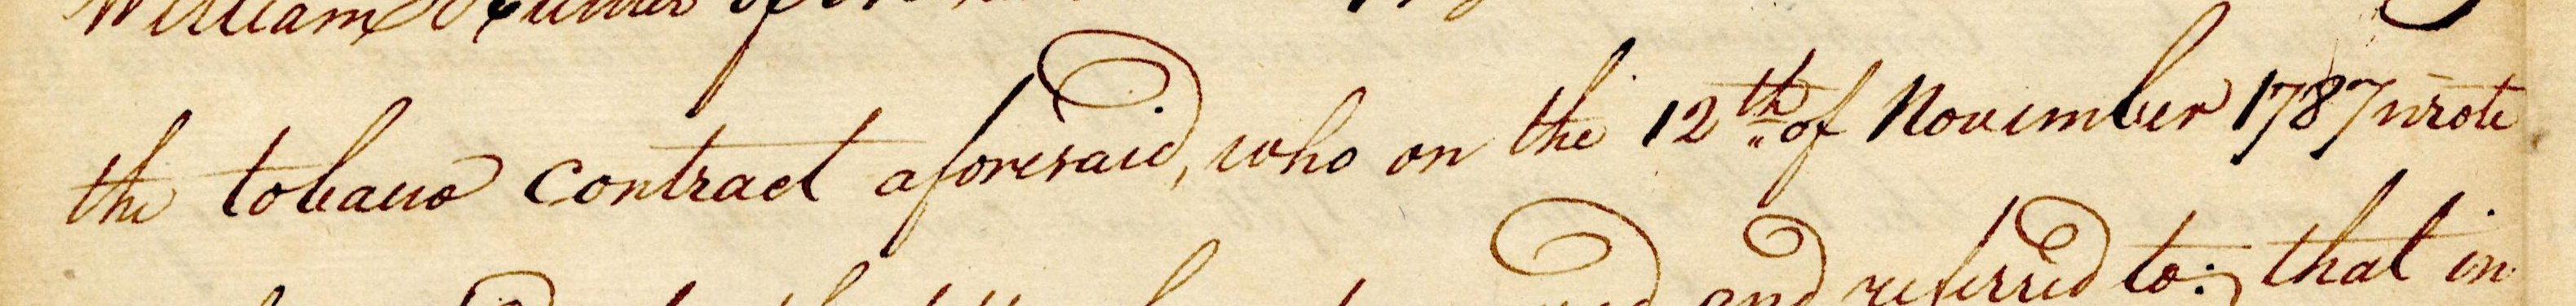the tobacco contract aforesaid, who on the 12^th. of November 1787 wrote
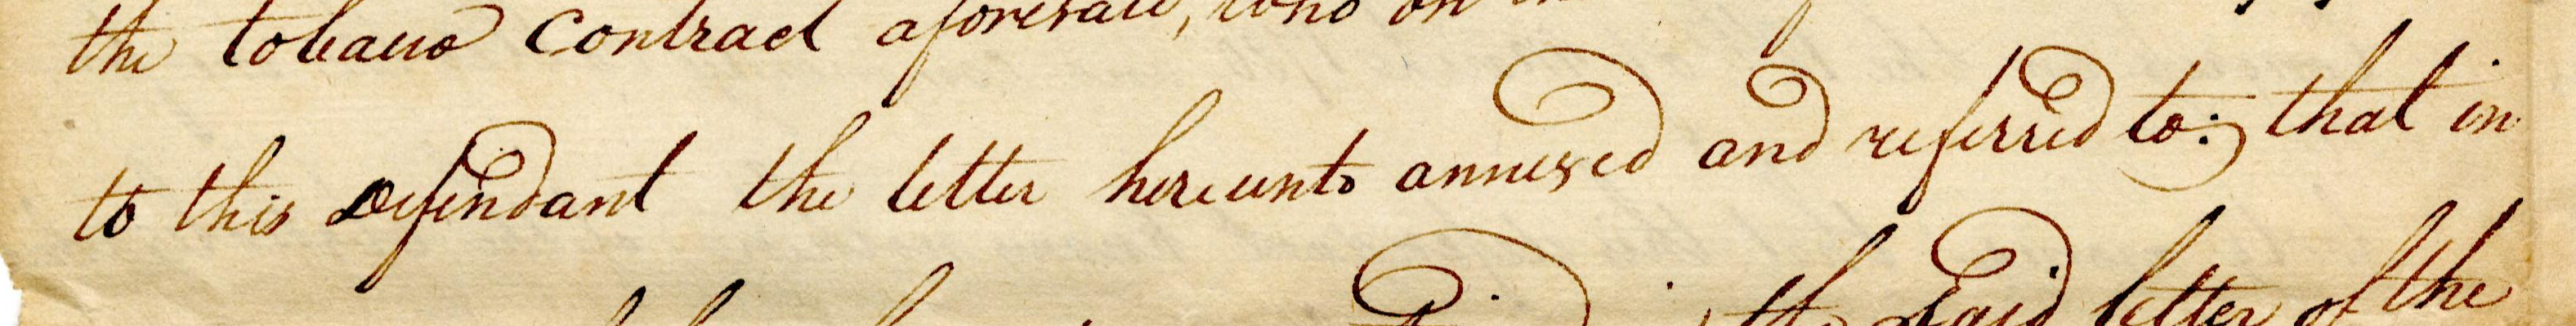to the defendant the letter hereunto annexed and referred to: that in
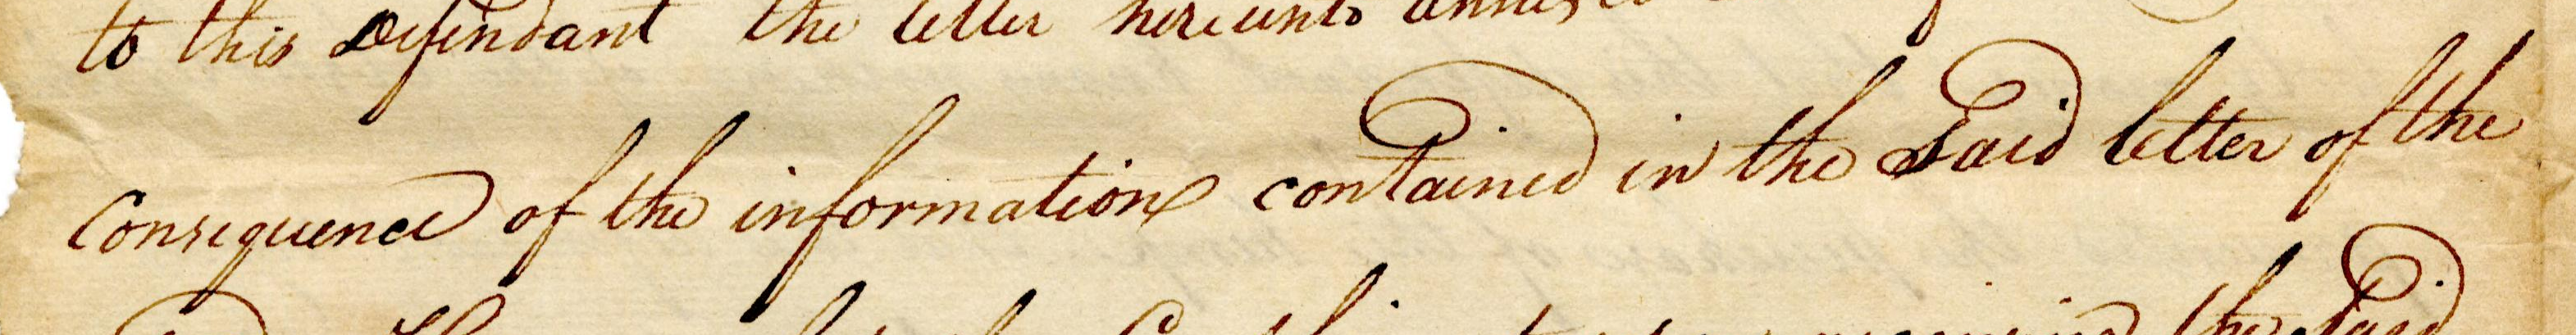Consequence of the information contained in the said letter of the
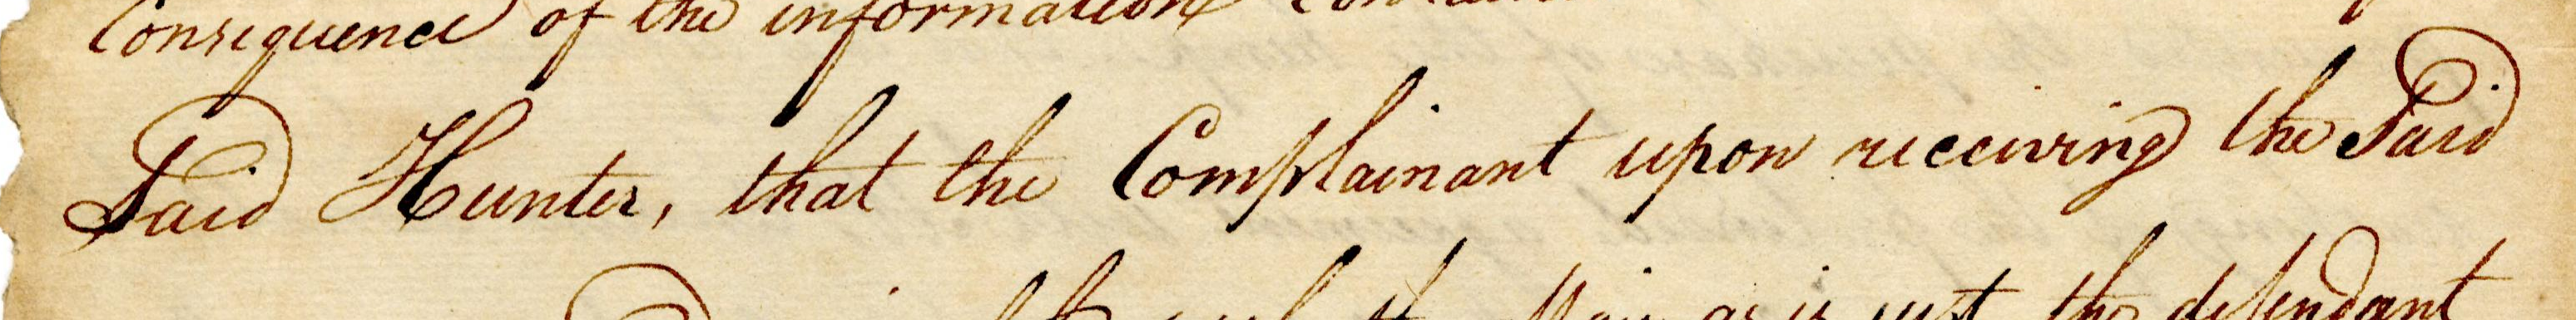Said Hunter, that the Complainant upon receiving the Said
